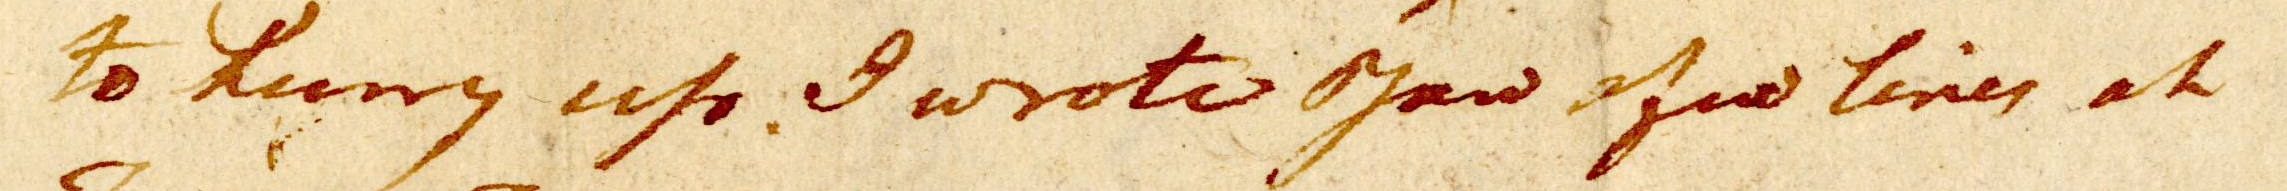to hurry up. I wrote you a few lines at
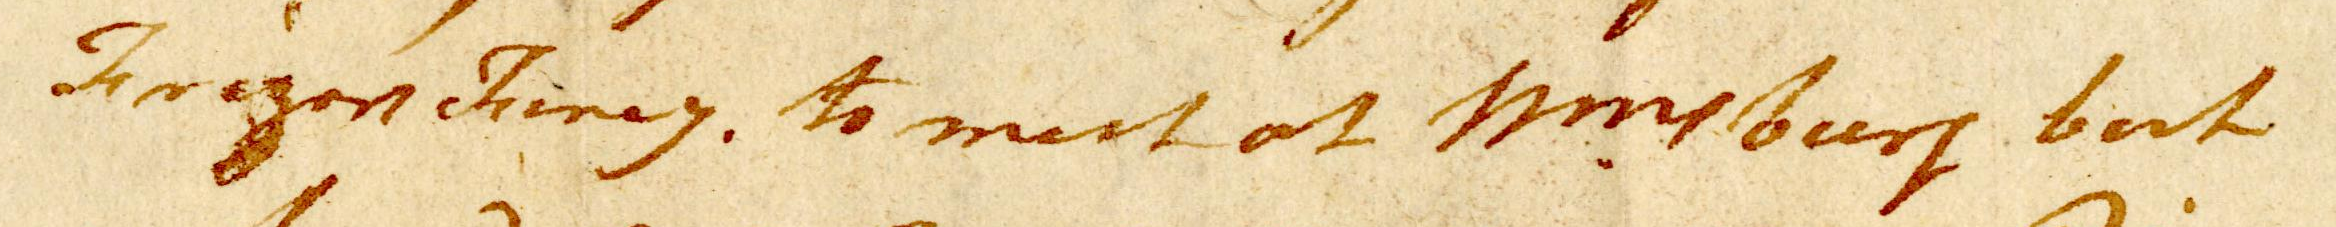Frazers Ferry to meet at W^msburg best
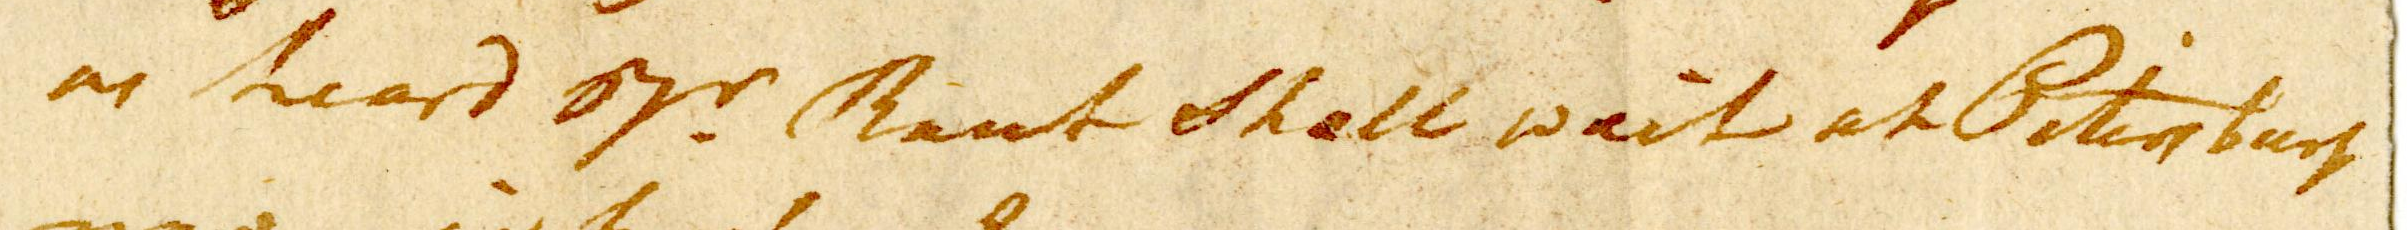as heard y^r Rout shall wait at Petersburg
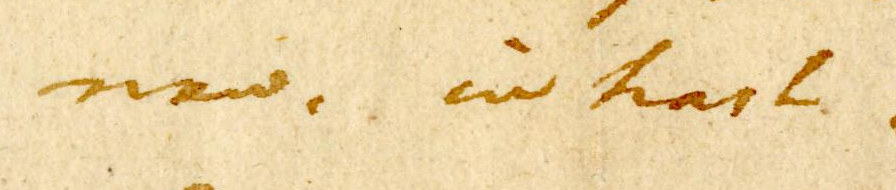now. in hast
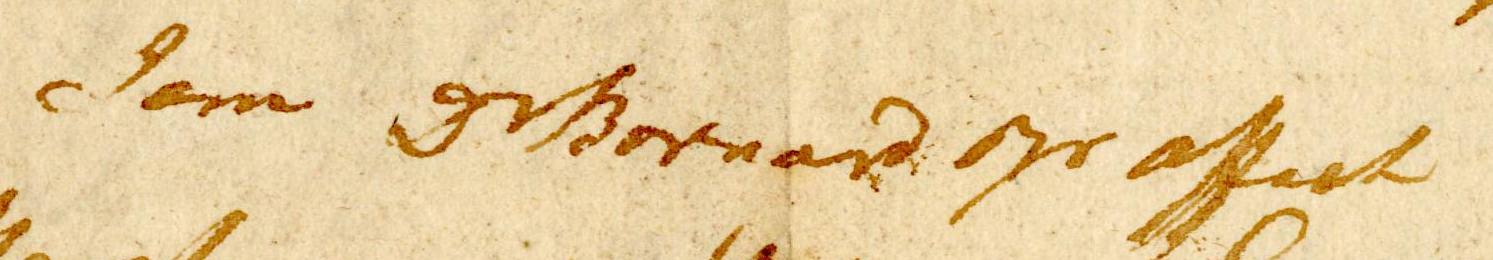I am D^r Barnard y^r affect
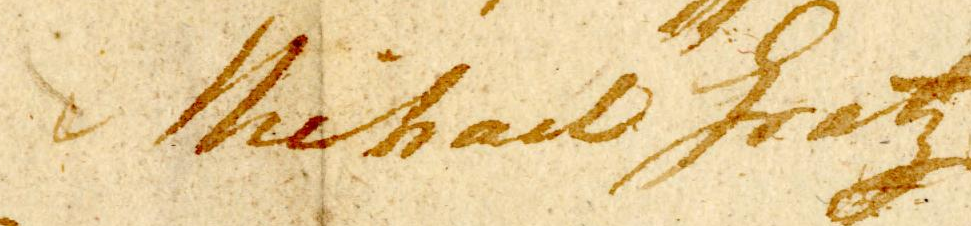Michael Gratz
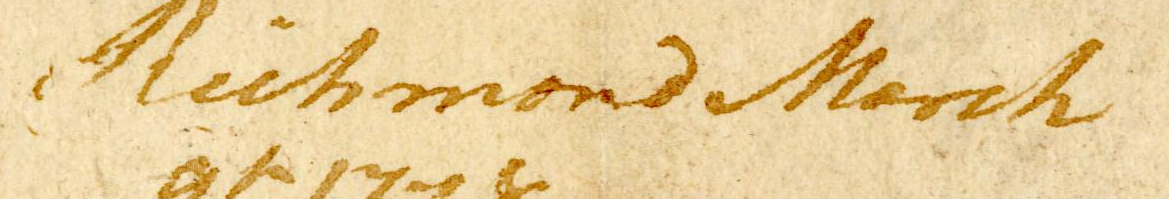Richmond March
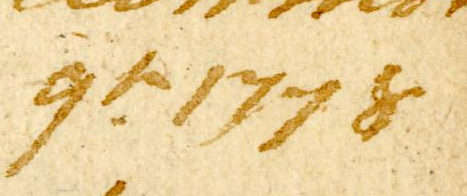9^t. 1778
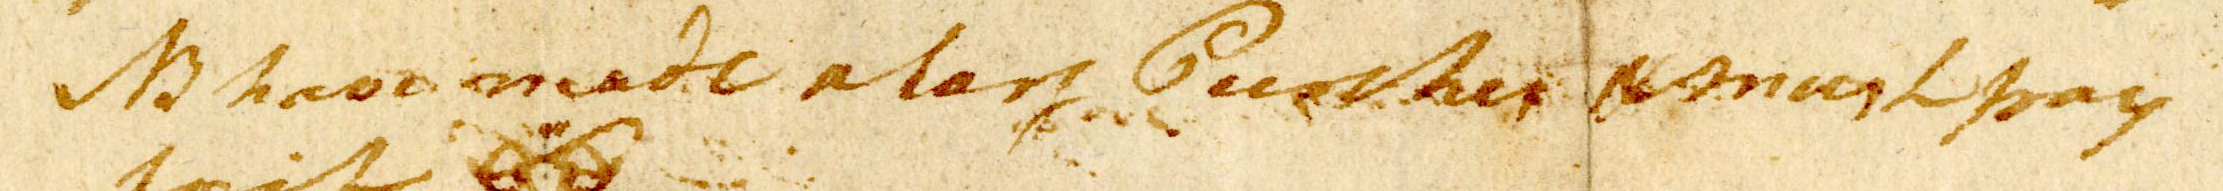NB have made a larg Purchase & must pay
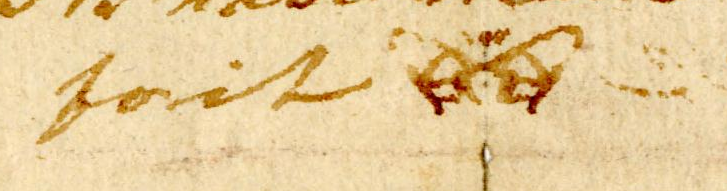for it
